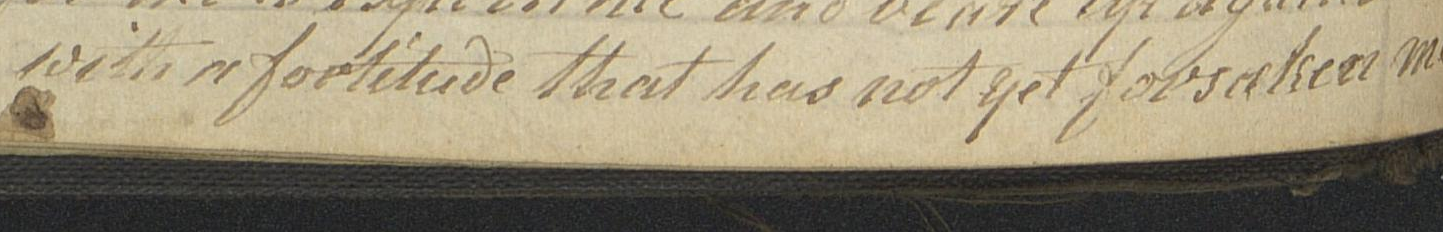with a fortitude that has not yet forsaken me
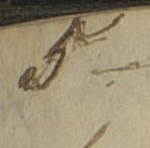5
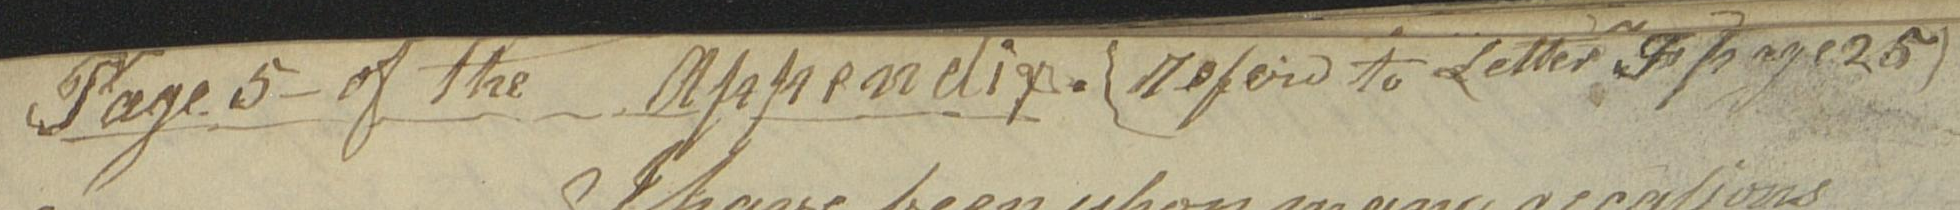Page 5 of the Appendix. (referd to Letter F page 25)
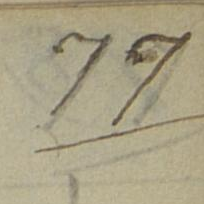77
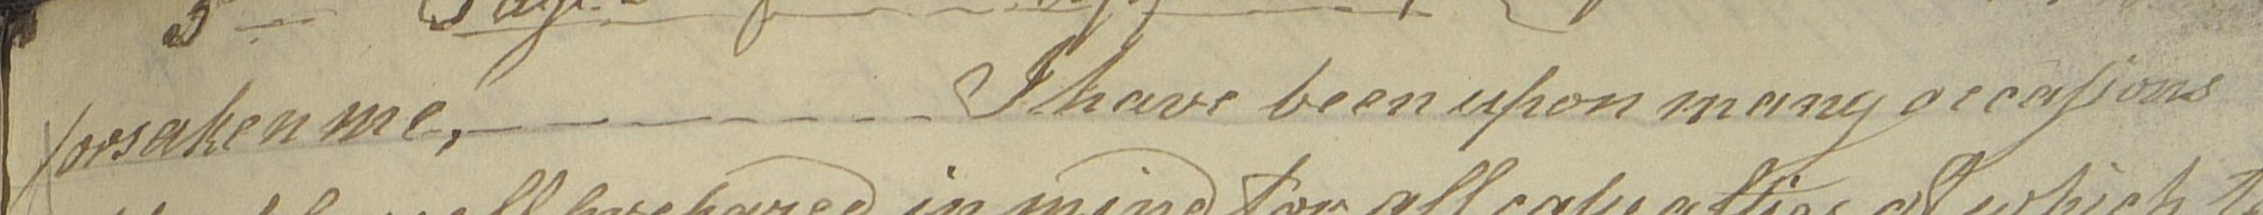forsaken me, I have been upon many occasions
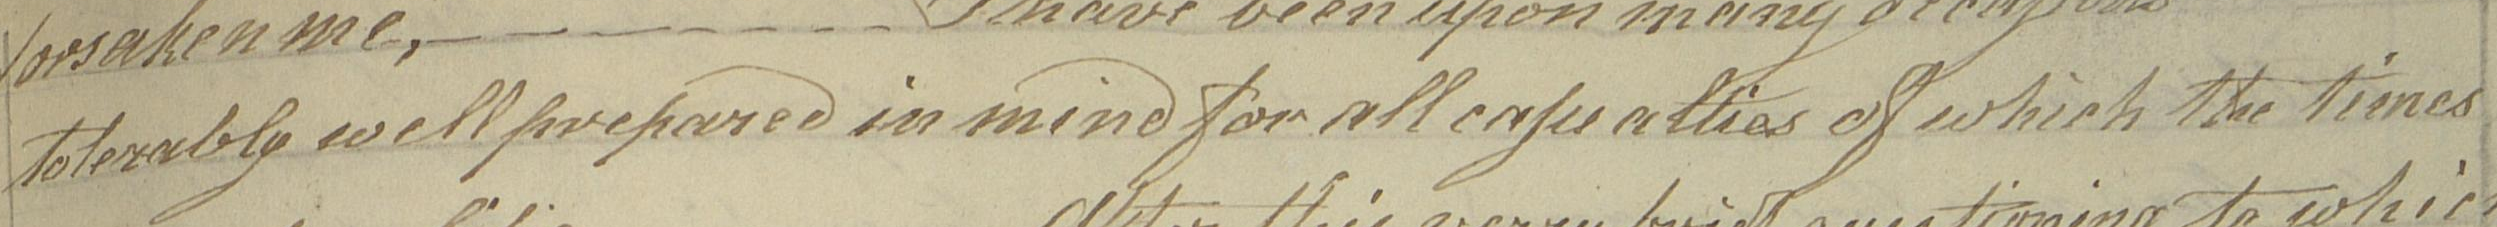tolerably well prepared in mind for all casualties of which the times
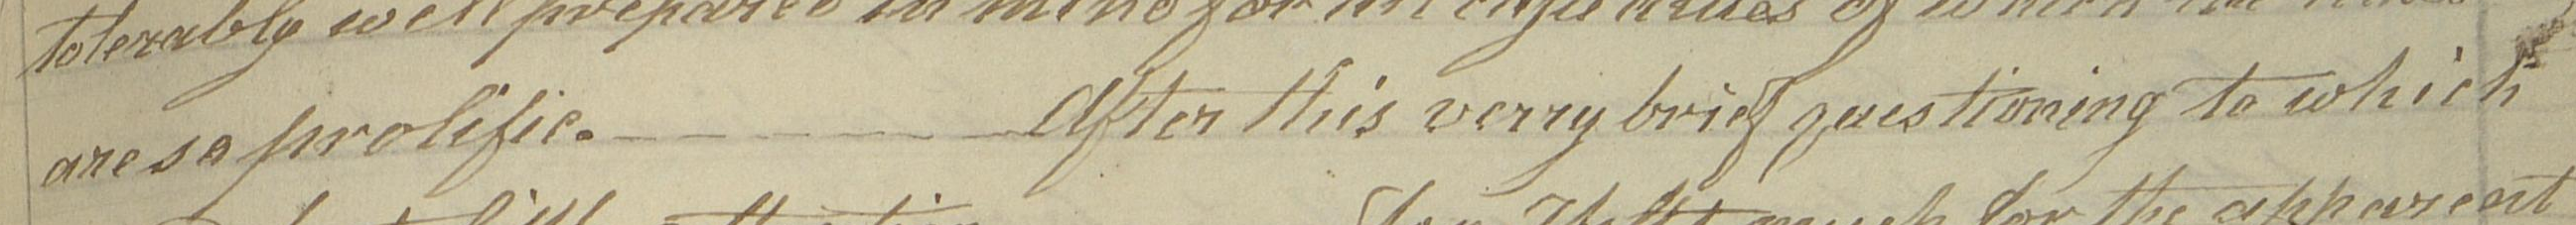are so prolific. After this verry brief questioning to which
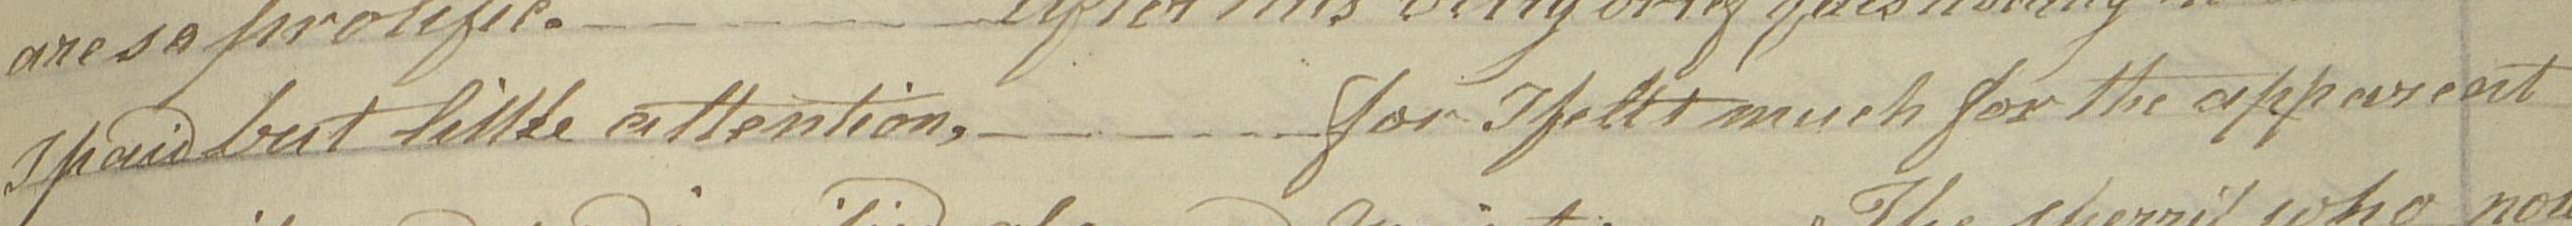I paid but little attention, for I felt much for the apparent
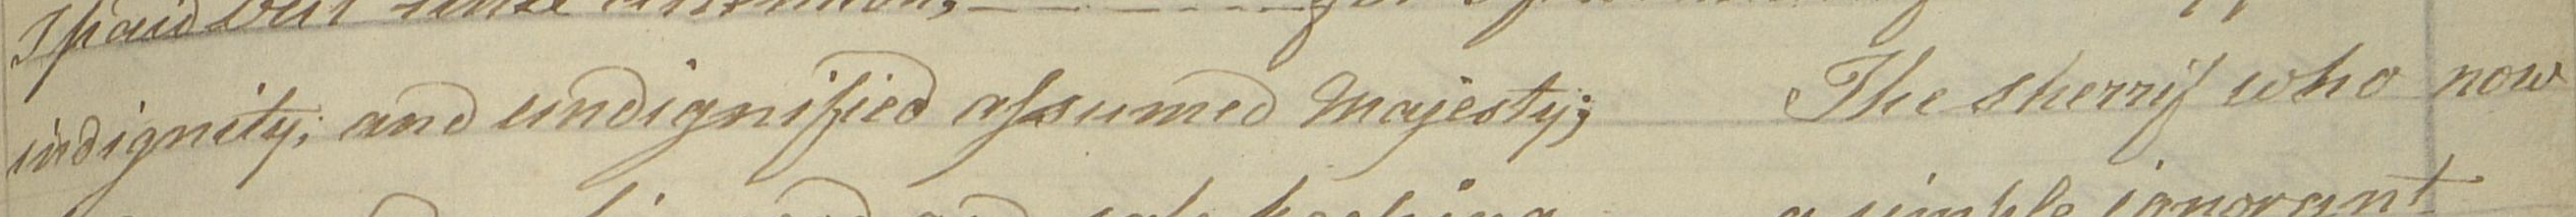indignity and undignified assumed majesty; The sherrif who now
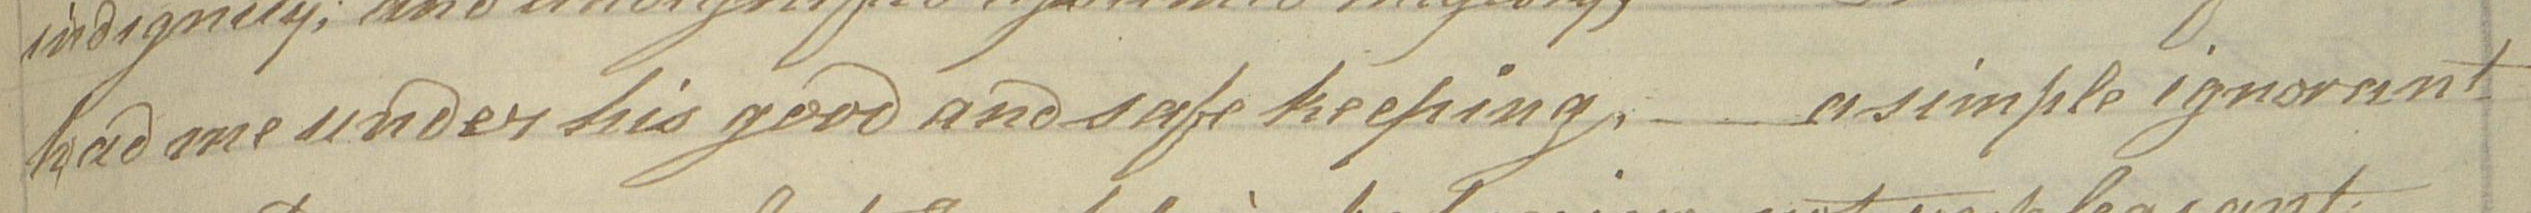had me under his good and safe keeping, a simple ignorant
